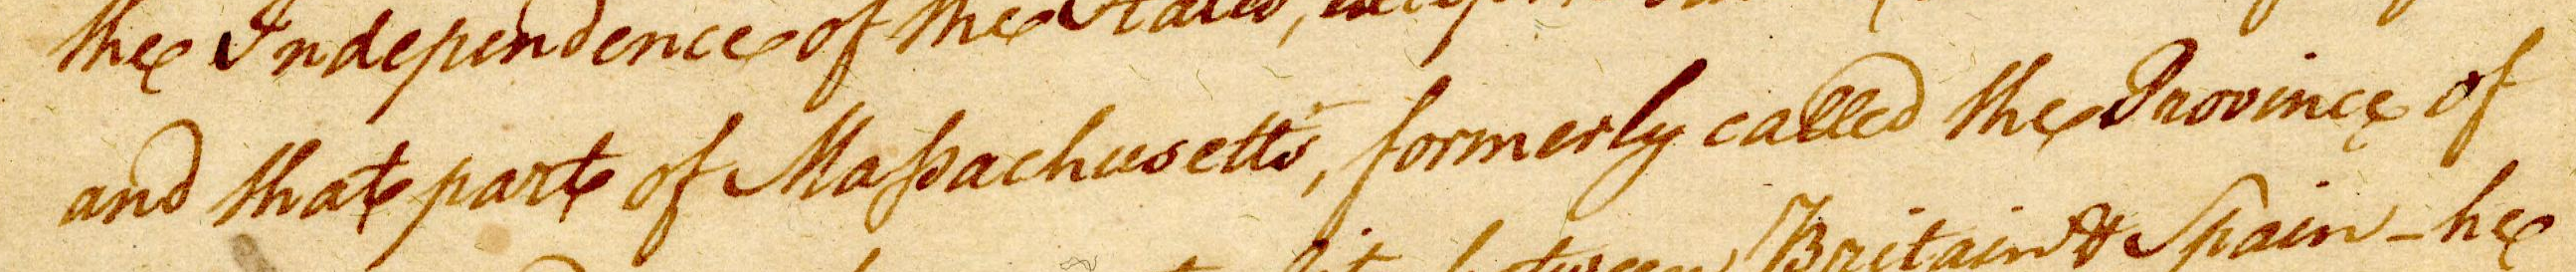and that part of Massachusetts, formerly called the Province of
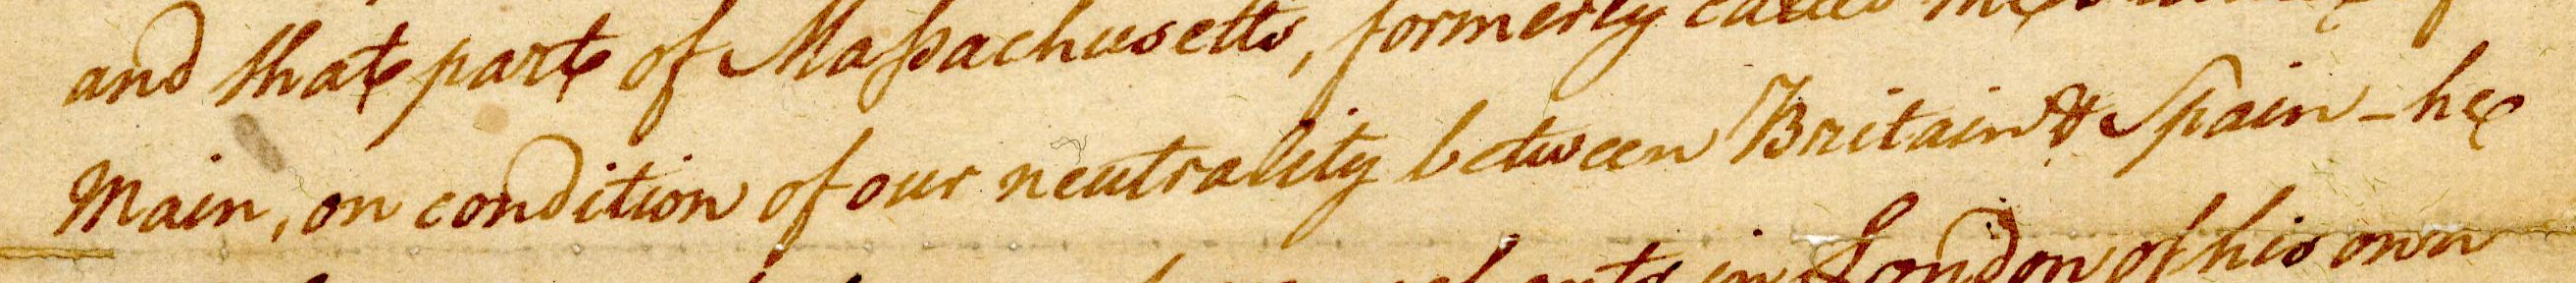Main, on condition of our neutrality between Britain & Spain- he
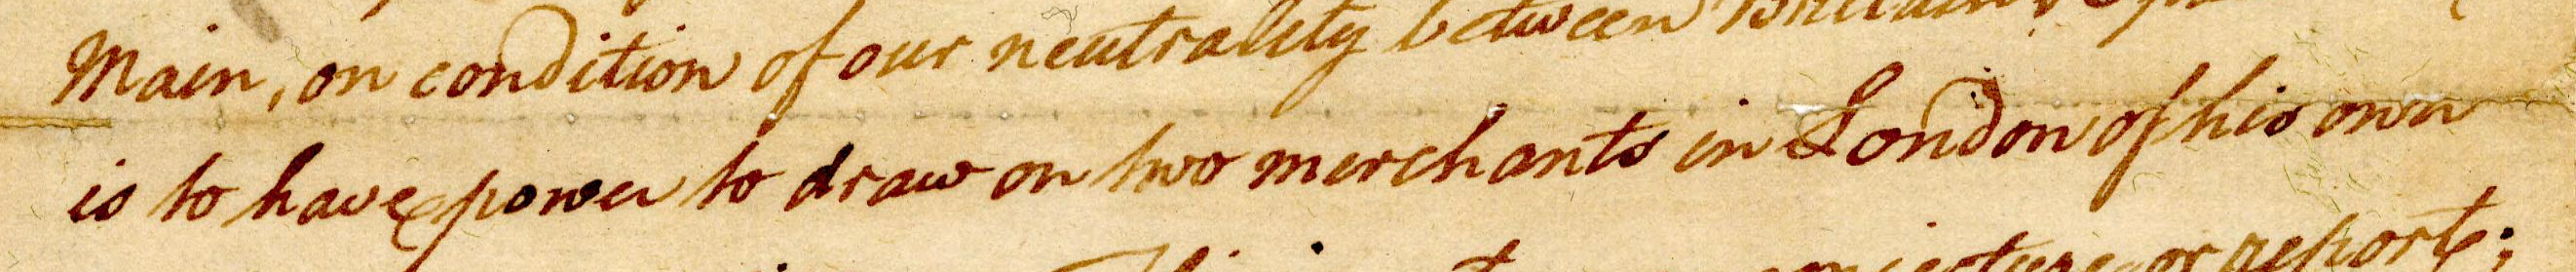is to have power to draw on two merchants in London of his own
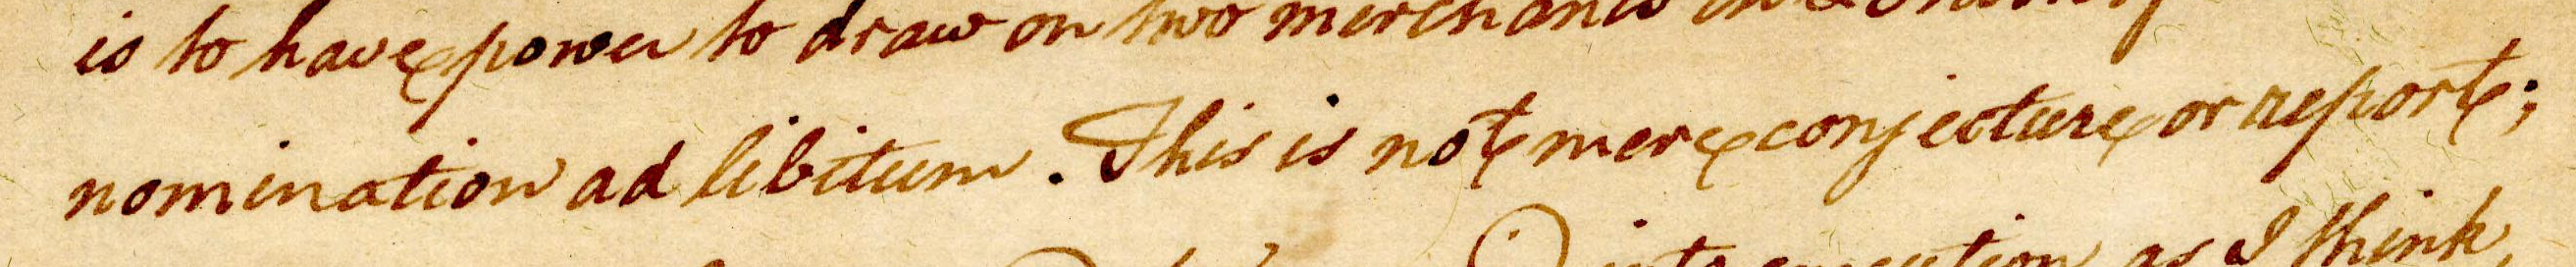nomination ad libitum. This is not mere conjecture or report;
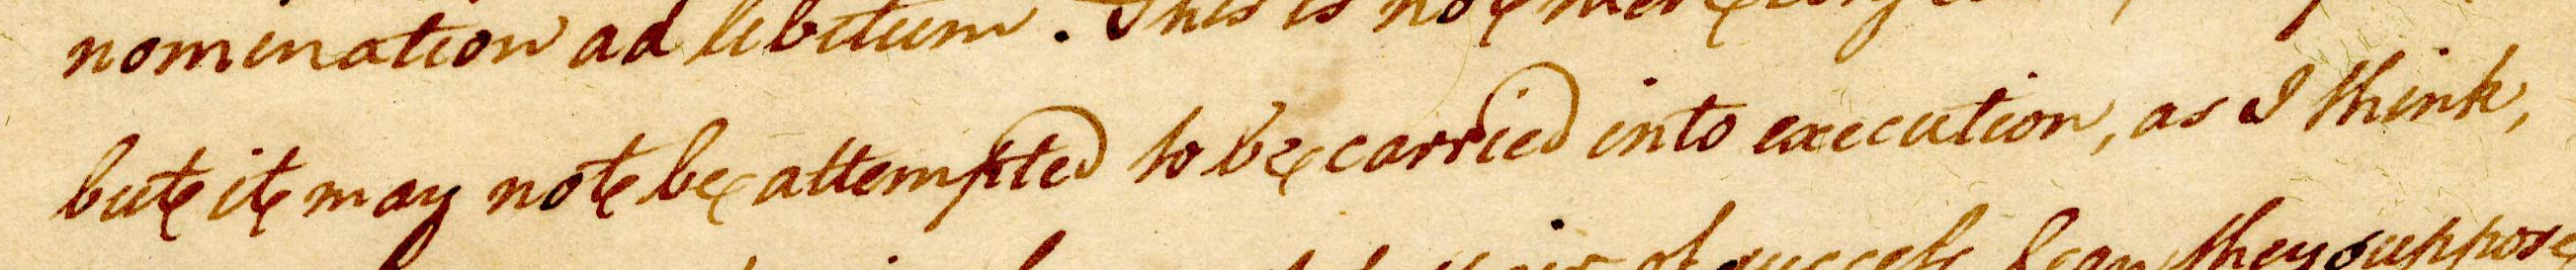but it may not be attempted to be carried into execution, as I think,
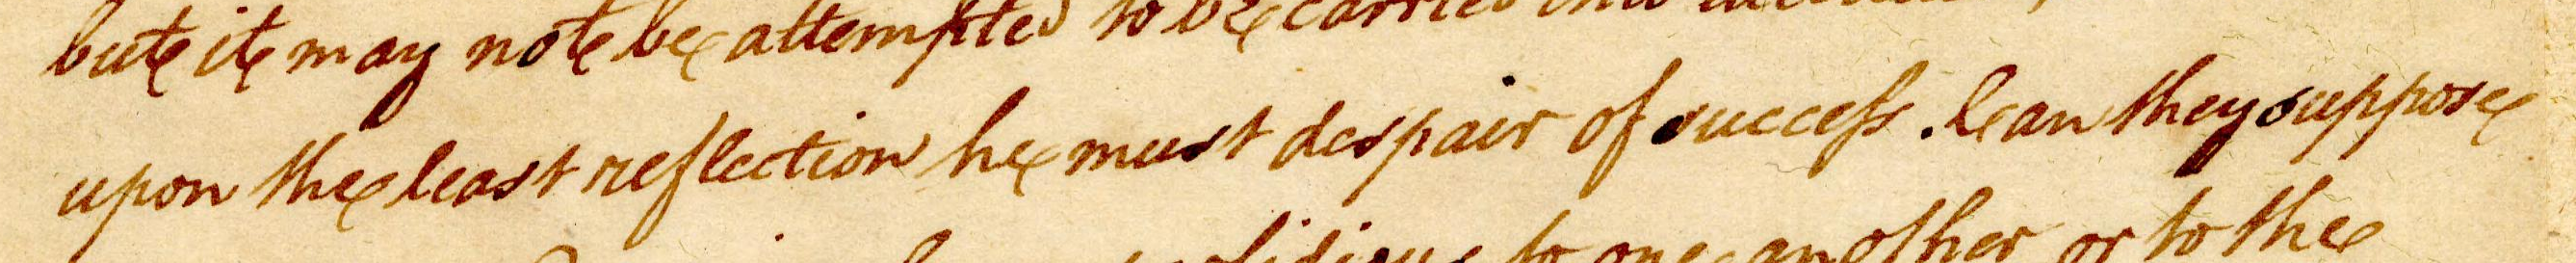upon the least reflection he must despair of success. Can they suppose
